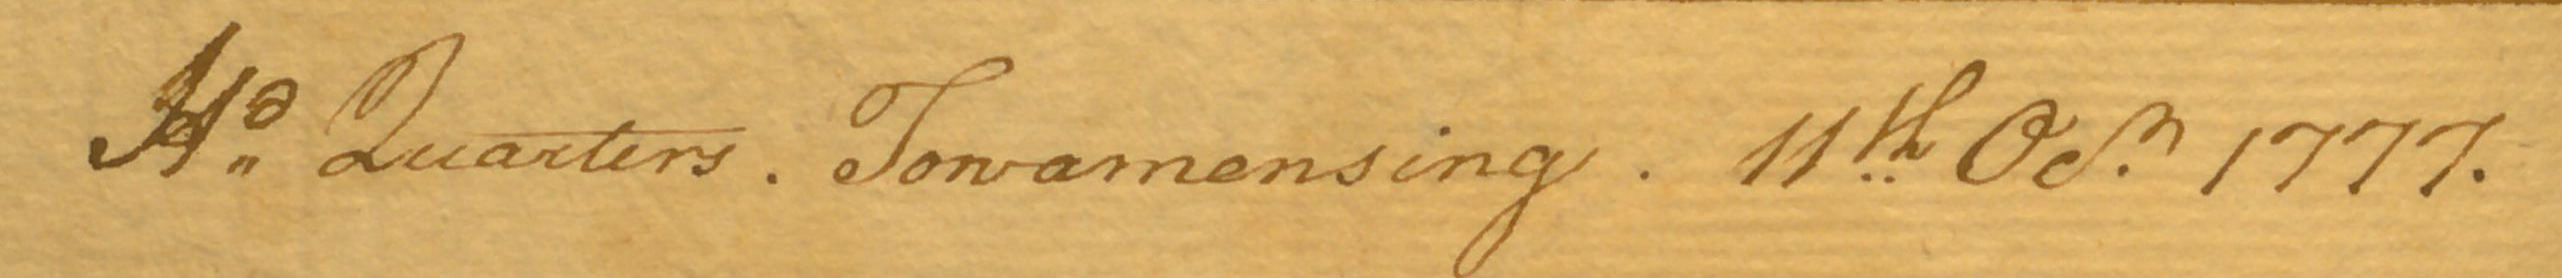H^d. Quarters. Towamensing. 11^th. Oc^r. 1777.
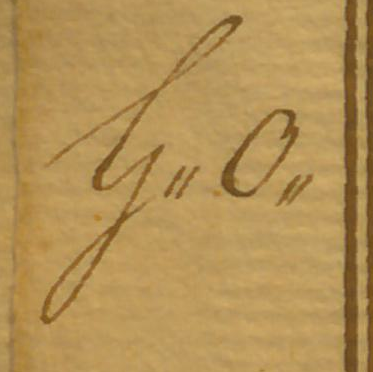G.O.
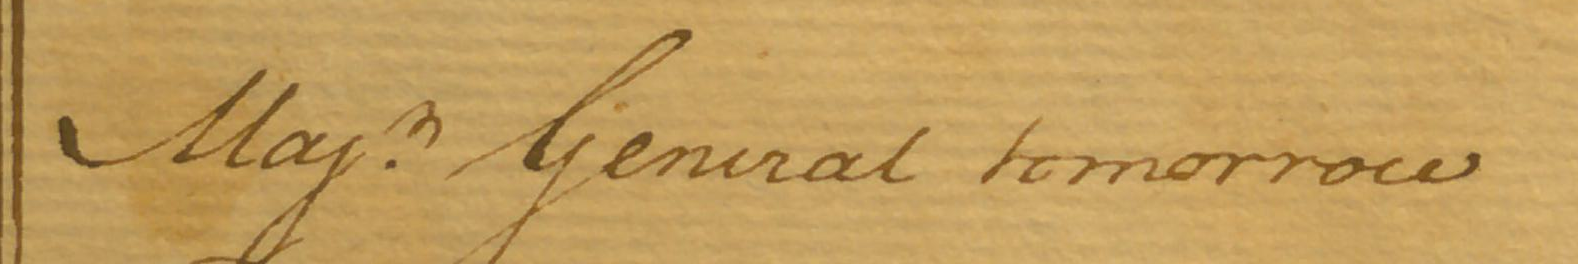Maj^r. General tomorrow
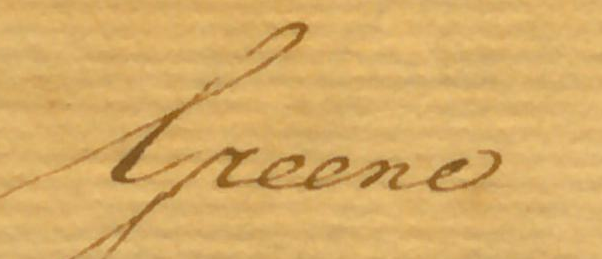Greene
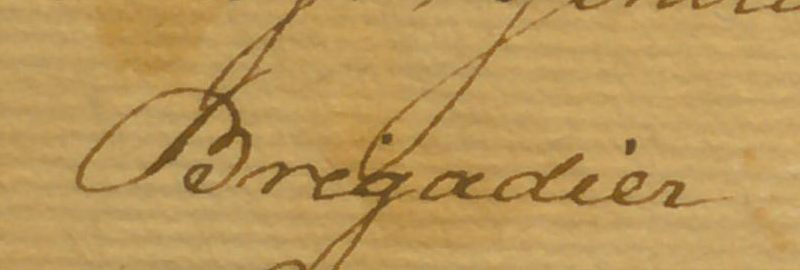Brigadier
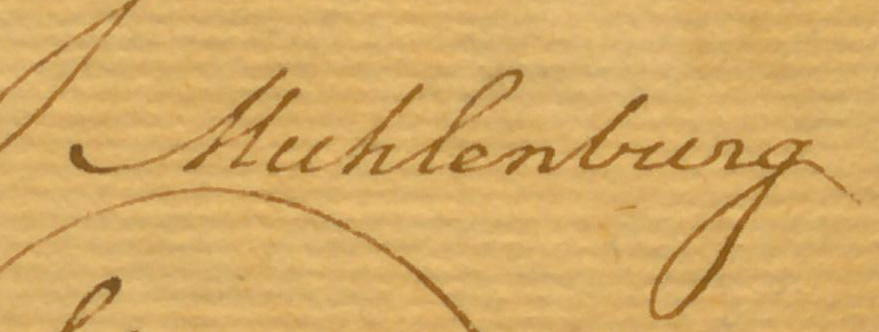Muhlenburg
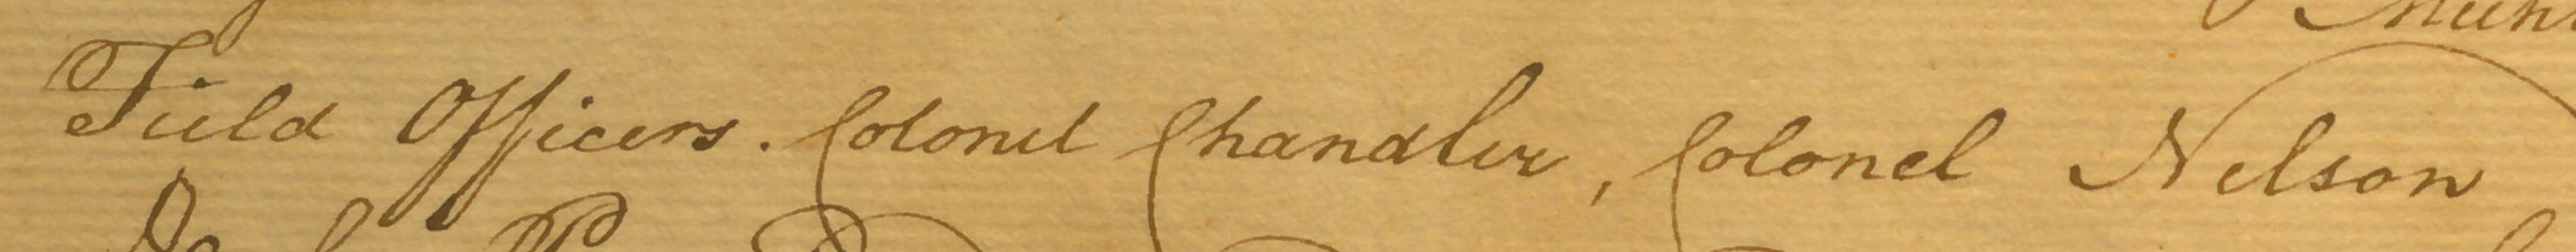Field Officers. Colonel Chandler, Colonel Nelson
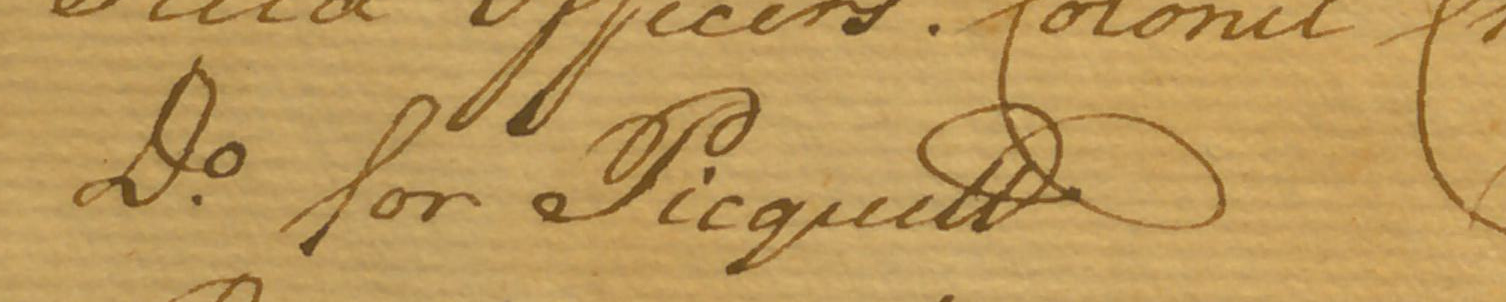D^o. for Picquett
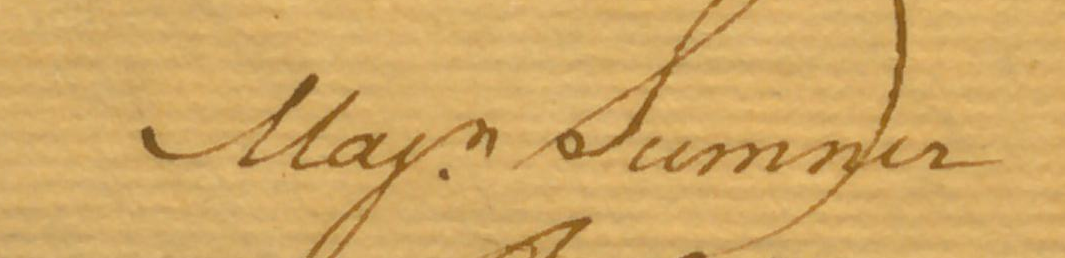Maj^r. Sumner
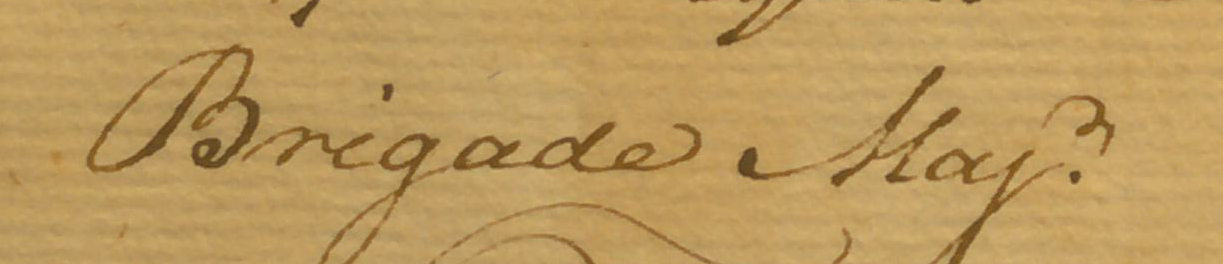Brigade Maj^r.
